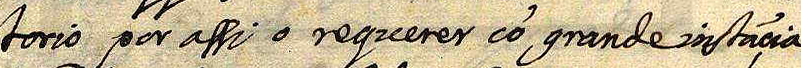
torio por assi o requerer cō grade instācia
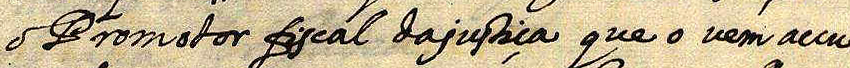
o Promotor fiscal da justiça que o uem accu
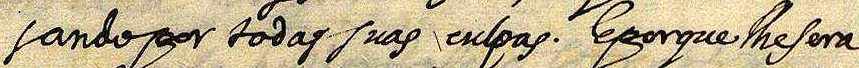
sando por todas suas culpas. E porque lhe sera
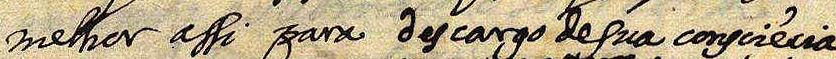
melhor assi para descargo de sua consciēcia,
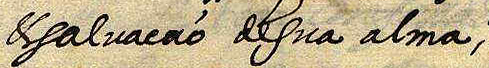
& saluacaõ de sua alma
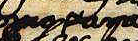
como para
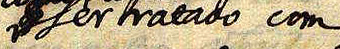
ser tratado com
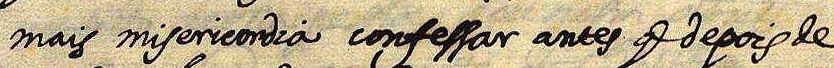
mais misericordia confessar antes q̄ depois de
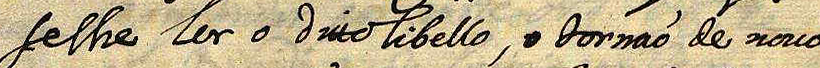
se lhe ler o ditto libello, o tornaõ de nouo
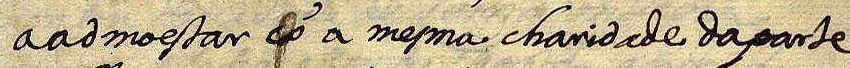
a admoestar cō a mesma charidade da parte
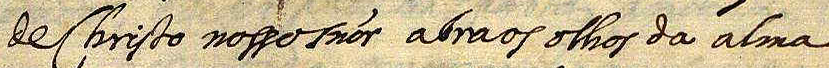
de Christo nosso snōr abra os olhos da alma
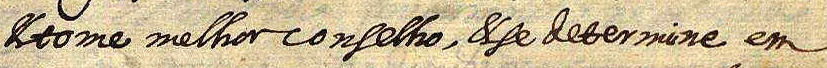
& tome melhor conselho, & se determine em
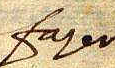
fazer
